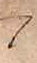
7
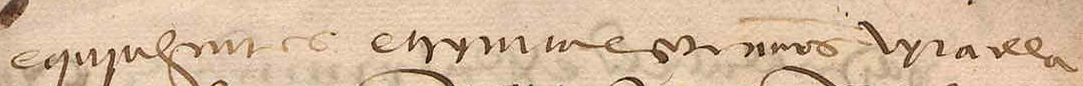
e qujnhentos e trymta e sete anos vyra ella
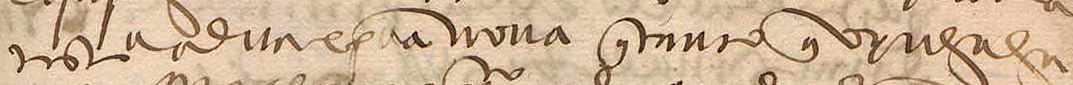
testa a dita xp̄aa noua q̄ tanto q̄ vynha ha
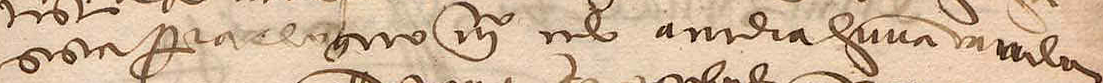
sesta fra lloguo mto cedo acendia huūa candea
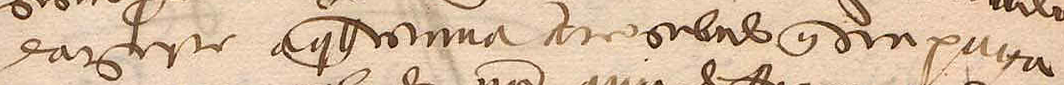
dazeyte a q̄ll estaua ate o sabado q̄ se apaga
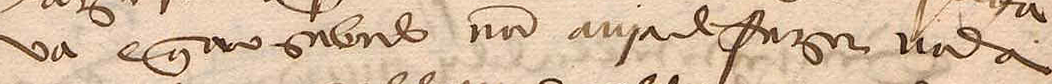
va e q̄ ao sabado nā a uja de fazer nada
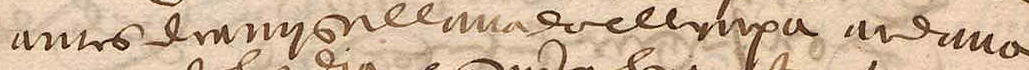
antes de camjsa llauada e llynpa andaua
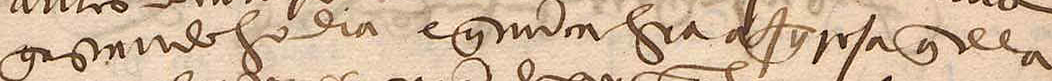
gastando ho dia e q̄ nūca hya a Jgreja q̄ ella
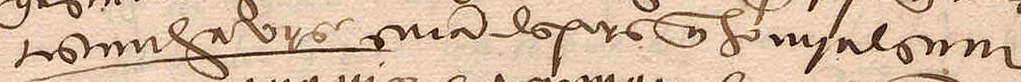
testemunha vyse senā despoys q̄ ho cura de sam
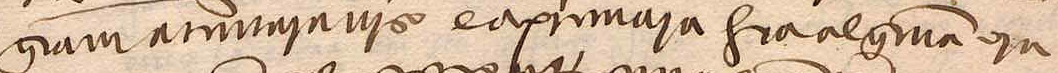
giam atentara njso e a premara hya alguūa ora
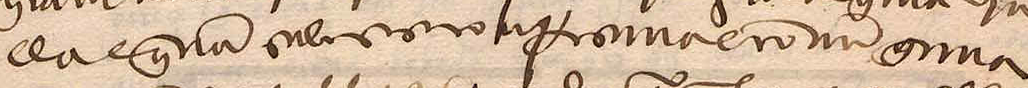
lla e q̄ nā sabe se se confesaua e comūgaua
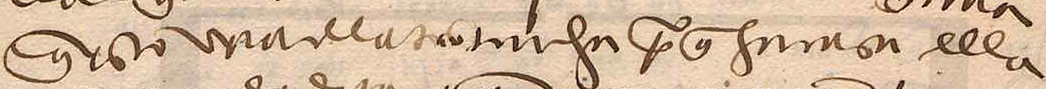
e q̄ ysto vyra ella testemunha p̄oq̄ ha casa della
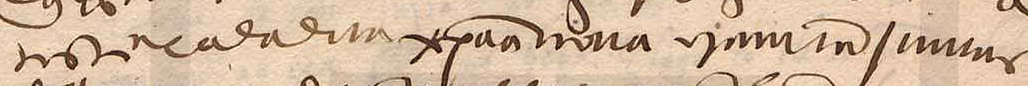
testa e a da dita xp̄aa noua eram tā Juntas
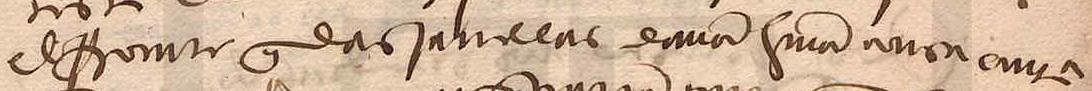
e defromte q̄ das Janellas dauā huā cousa emta
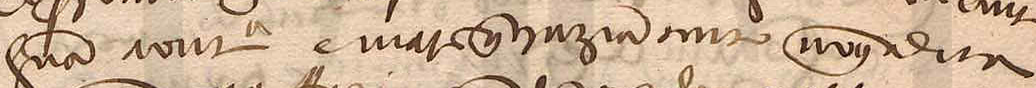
huā a outa e majs q̄ traziā tento no q̄ a dita
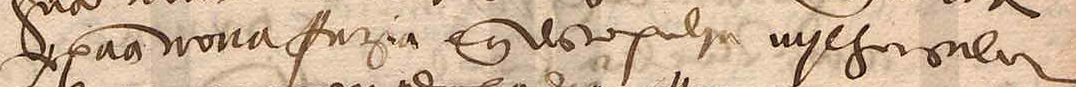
xpaā noua fazia e q̄ desto podja mjlhor saber
